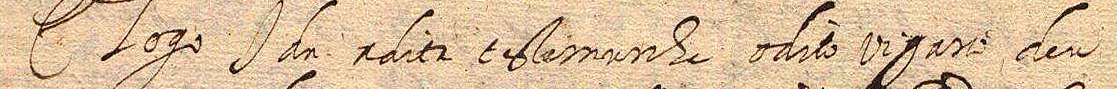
& Logo Ida a dita testemunha o dito vigario deu
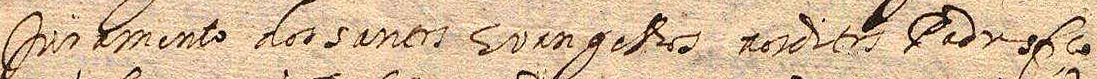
Juramento dos santos Evangelhos aos ditos Padre frco
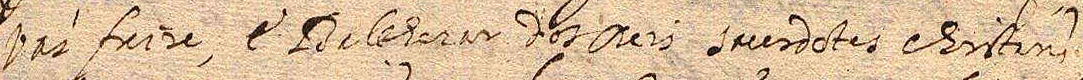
vaz freire, e Balthazar dos Reis sacerdotes christans
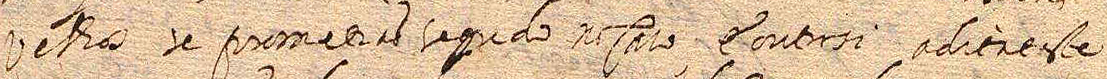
velhos se prometiaõ segredo no Caso, e outrosi a dita teste
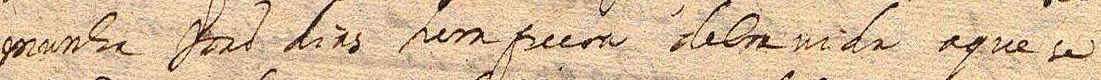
munha Joaõ dias hera pecoa de boa uida a que se
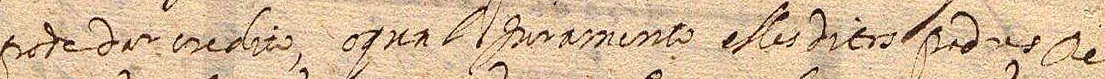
pode dar credito, o qual Juramento elles ditos padres Re
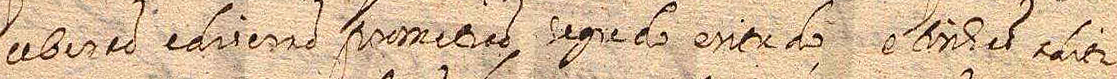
ceberaõ e diseraõ prometiaõ segredo em tudo, e tinhaõ a dita
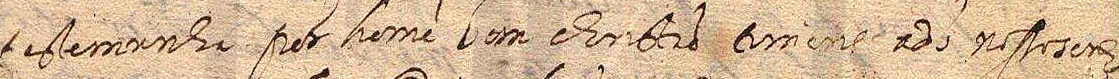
testemunha por homē bom christaõ temente a ds̄ nosso senr̄
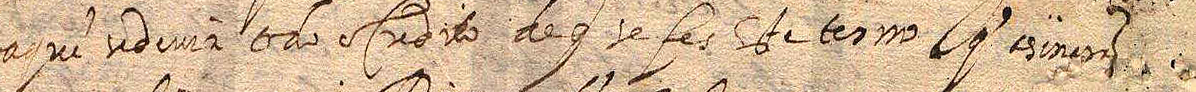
a quē se deuia todo o Credito de q̄ se fes este termo q̄ asinaraõ
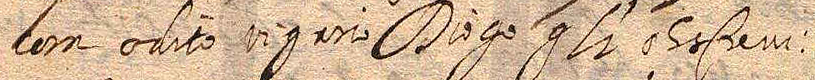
com o dito vigario Diogo glz̄ o escreui.
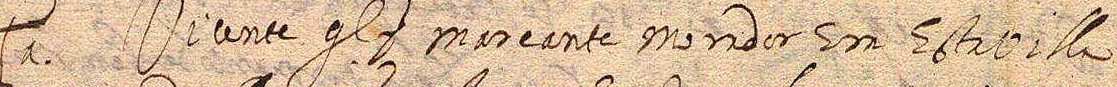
Ta. Vicente glz̄ mareante morador Em Esta villa
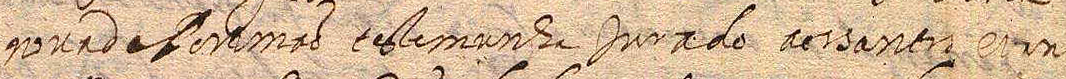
noua de Portimaõ testemunha Jurado aos santos evan
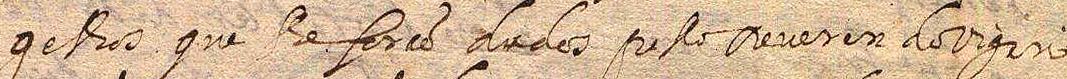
gelhos que lhe foraõ dados pello Reuerendo vigario
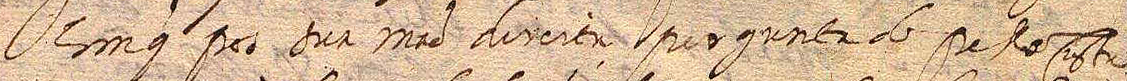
Em q̄ pos sua maõ direita perguntado pello Custu
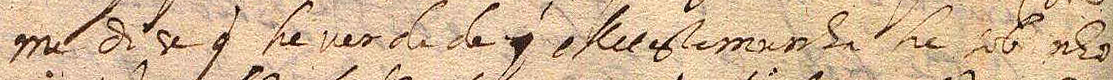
me dise q̄ he uerdade q̄ elle testemunha he sob__nho
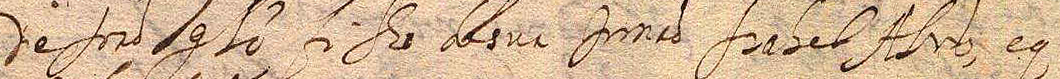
de Joaõ glz̄, filho de sua Jrmaõ Jsabel ALvs̄, e q̄
